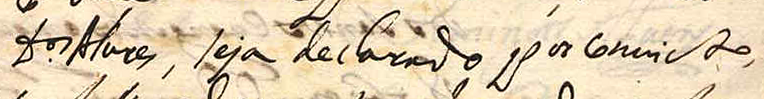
D.os Alures, seja declarado por conuicto,
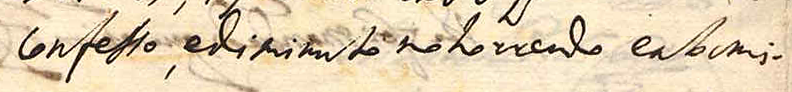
confesso, e diminuto no horrendo e abomi
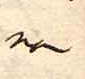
na
